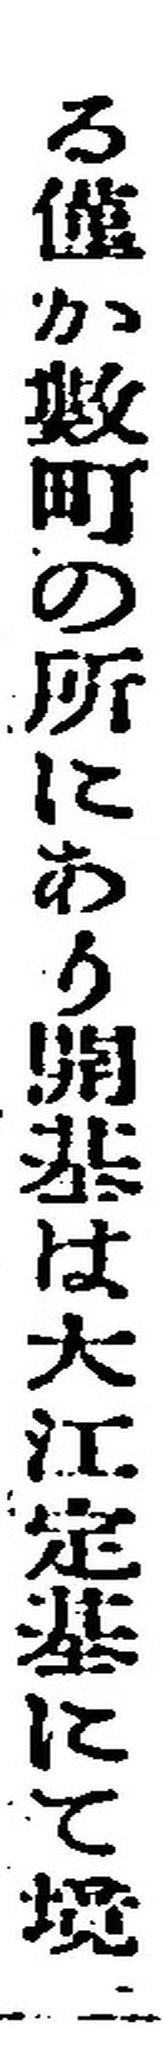る僅か数町の所にあり開基は大江定基にて境
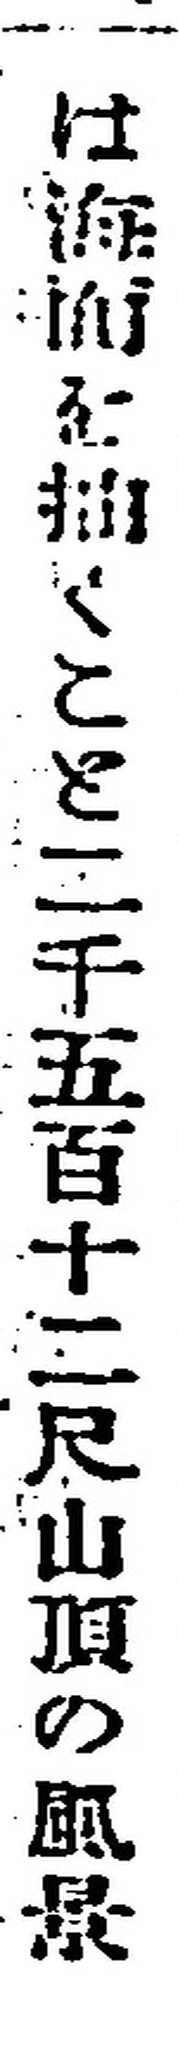は海面を抽くこと二千五百十二尺山頂の風景
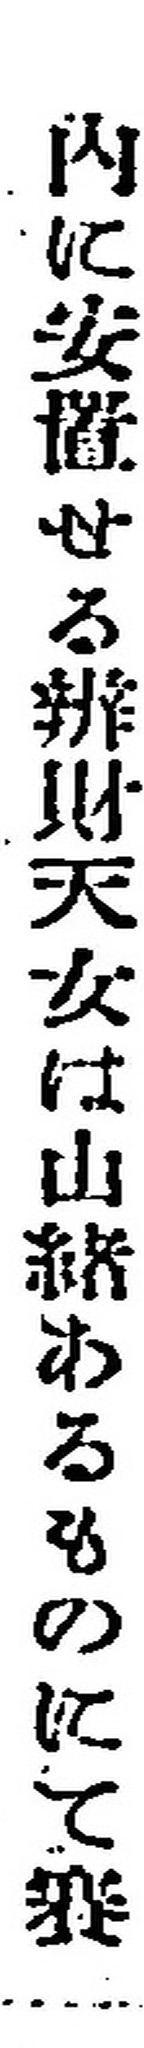内に安置せる弁財天女は由緒あるものにて賽
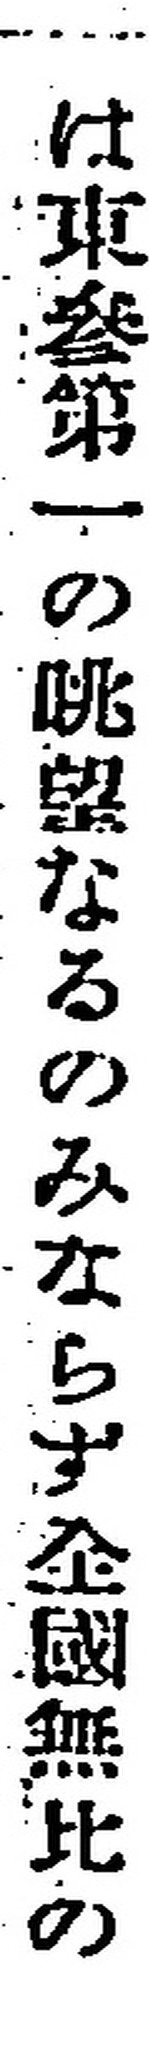は東参第一の眺望なるのみならず全国無比の
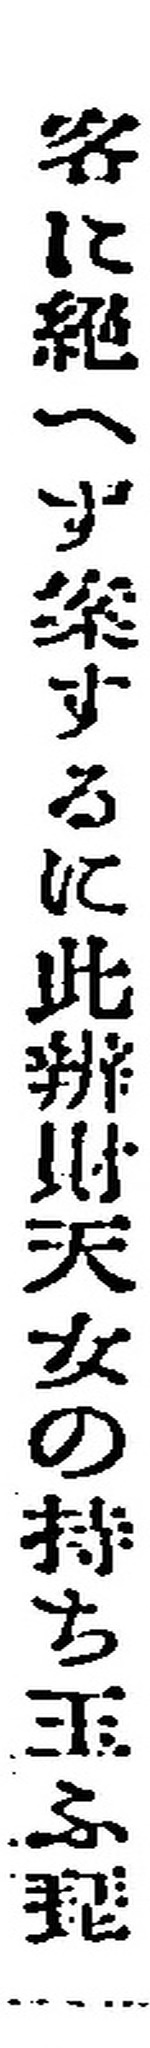客に絶へず案するに此弁財天女の持ち玉ふ琵
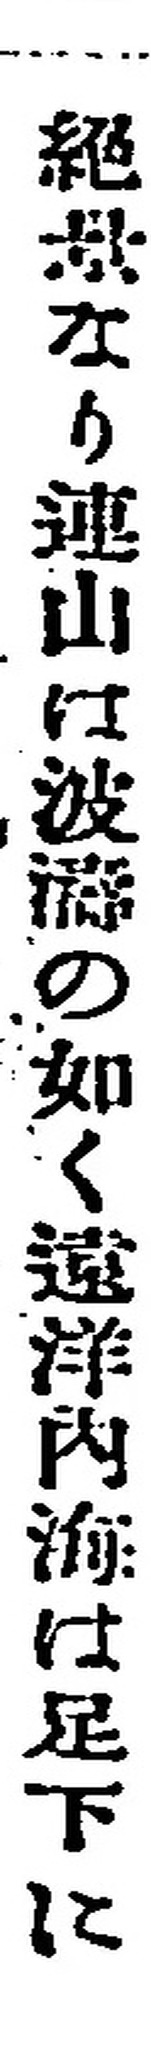絶景なり連山は波濤の如く遠洋内海は足下に
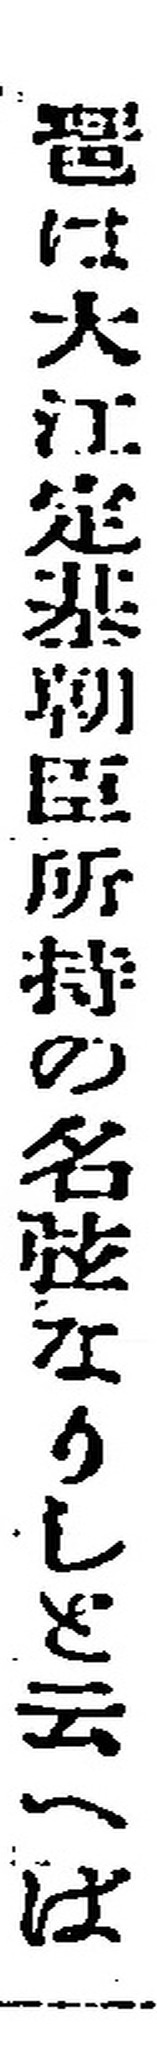琶は大江定基朝臣所持の名弦なりしと云へば
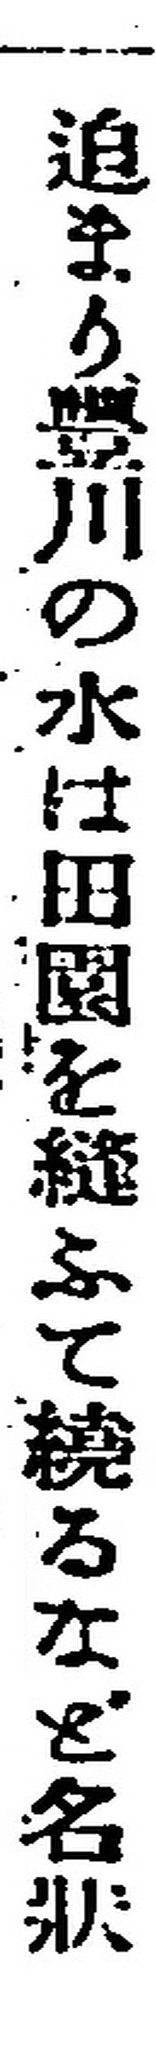迫まり豊川の水は田園を縫ふて繞るなど名状
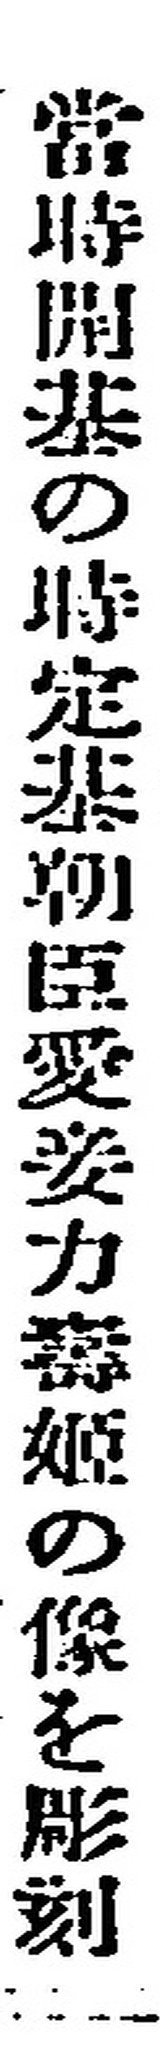当時開基の時定基朝臣愛妾力寿姫の像を彫刻
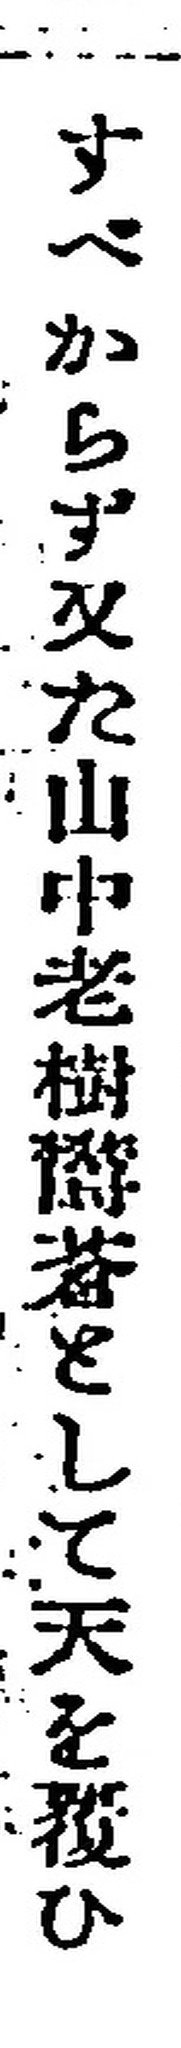すべからず又た山中老樹鬱蒼として天を覆ひ
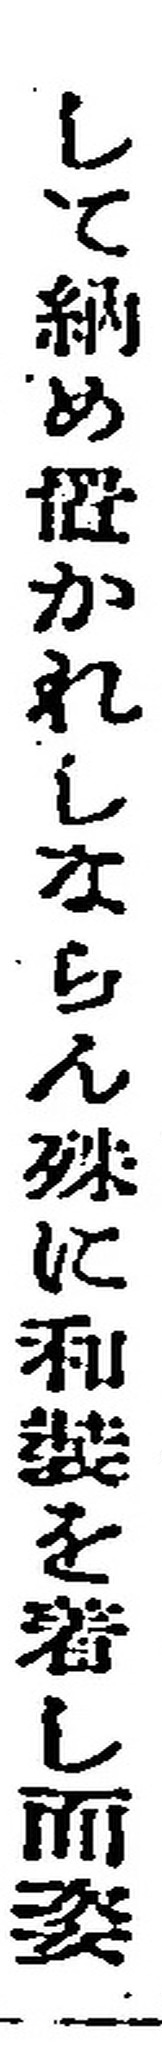して納め置かれしならん殊に和装を着し面姿
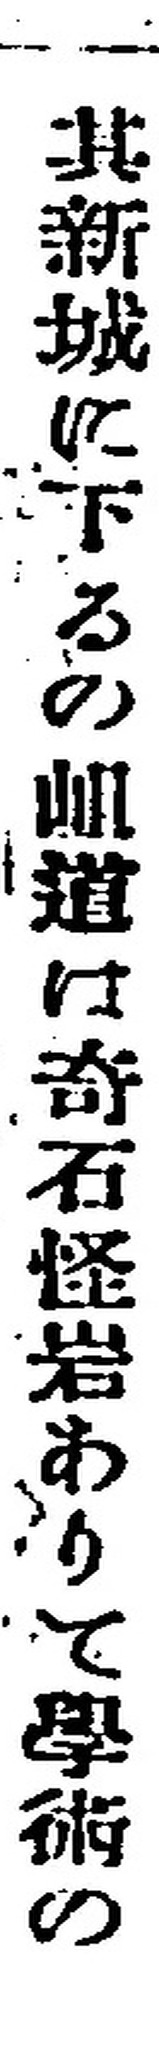其新城に下るの岨道は奇石怪岩ありて学術の
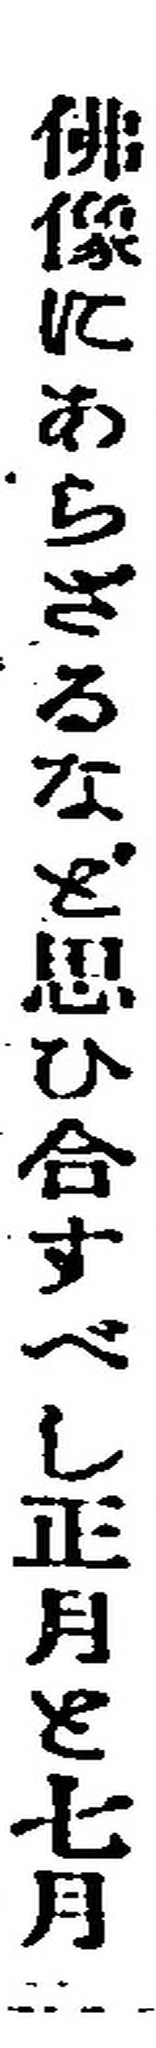仏像にあらざるなど思ひ合すべし正月と七月
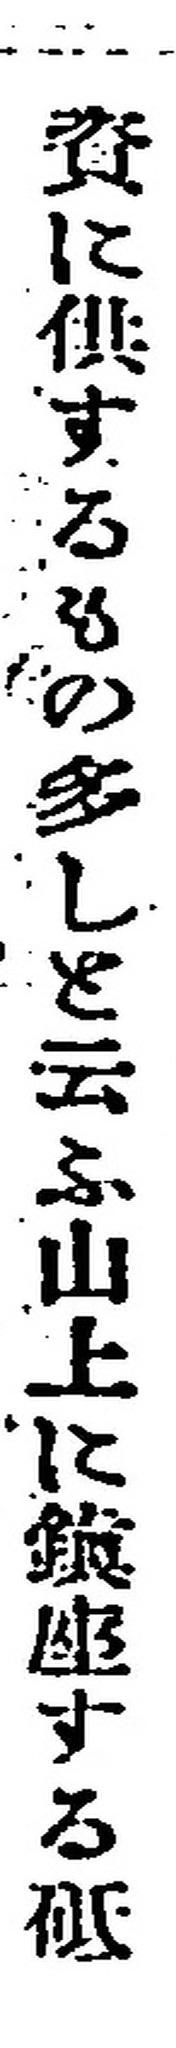資に供するもの多しと云ふ山上に鎮座する砥
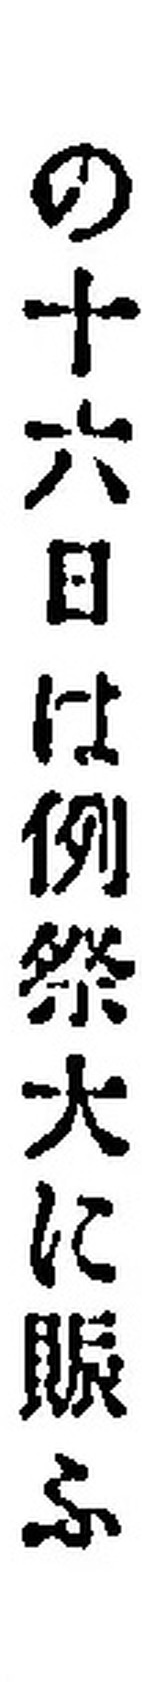の十六日は例大祭に賑ふ
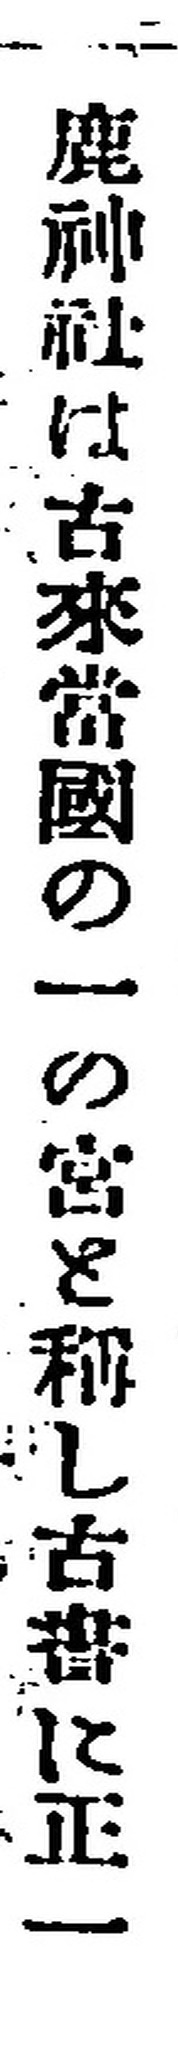鹿神社は古来当国の一の宮と称し古書に正一
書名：東参名勝案内
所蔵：国立国会図書館 National Diet Library, JAPAN
